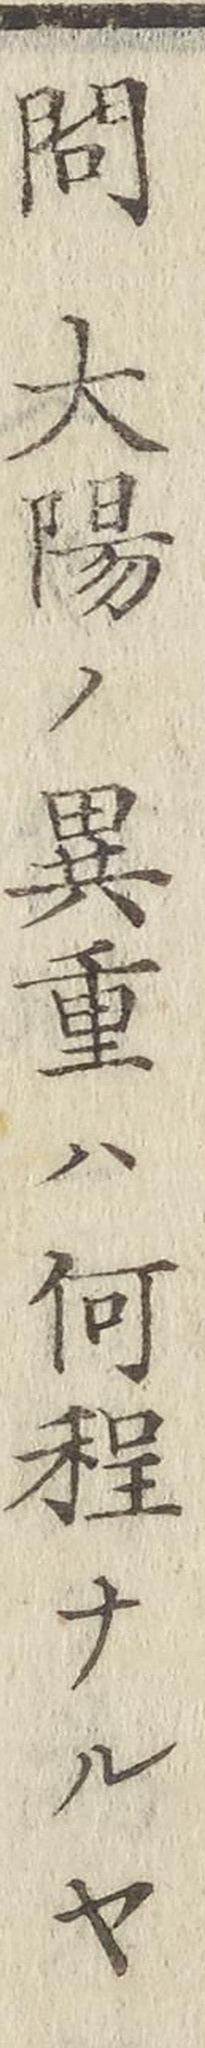問大陽ノ異重ハ何程ナルヤ
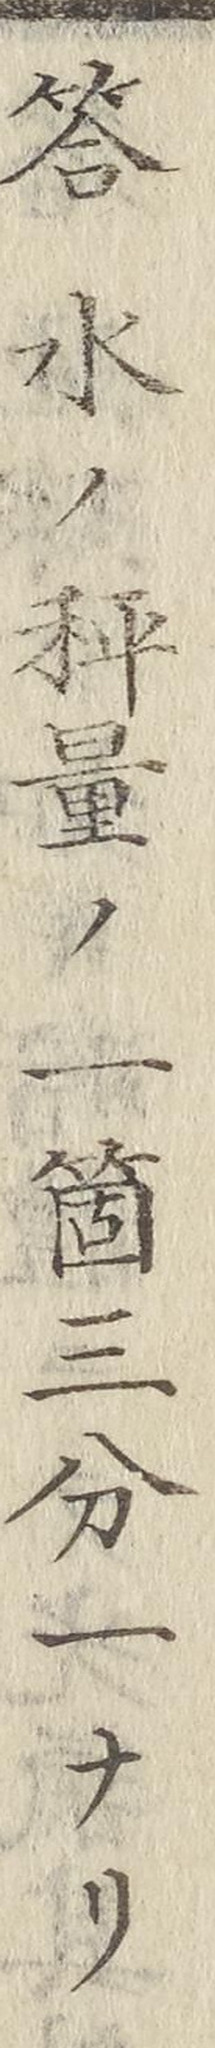答水ノ秤量ノ一個三分一ナリ
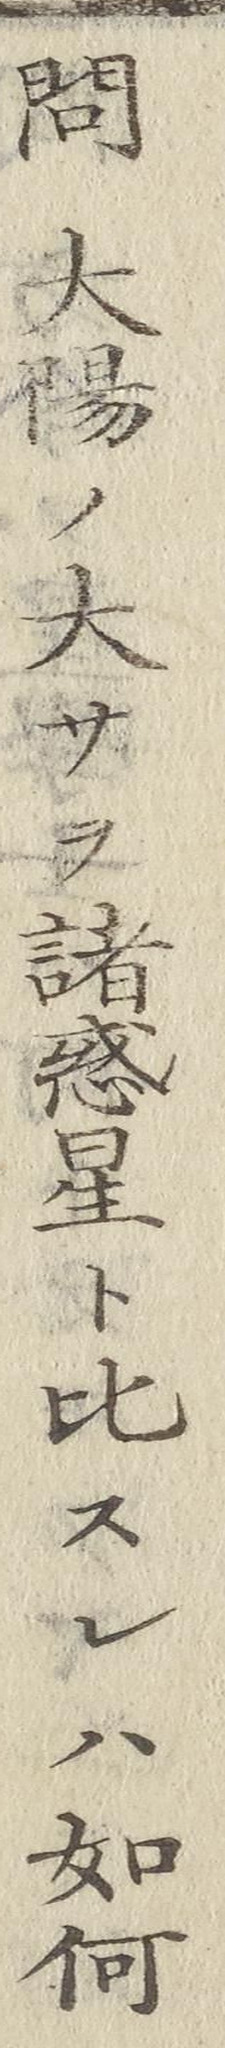問大陽ノ大サヲ諸惑星ト比スレハ如何
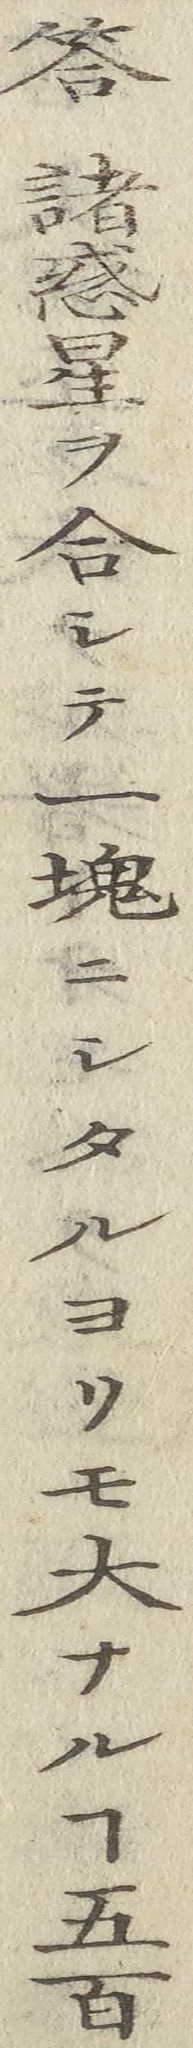答諸惑星ヲ合シテ一塊ニシタルヨリモ大ナルコト五百
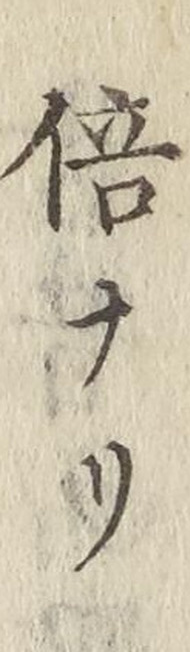倍ナリ
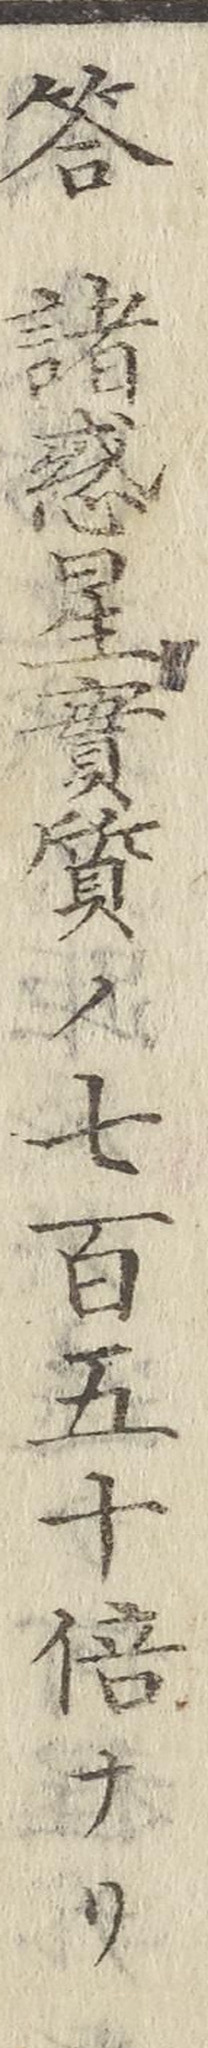答諸惑星実質ノ七百五十倍ナリ

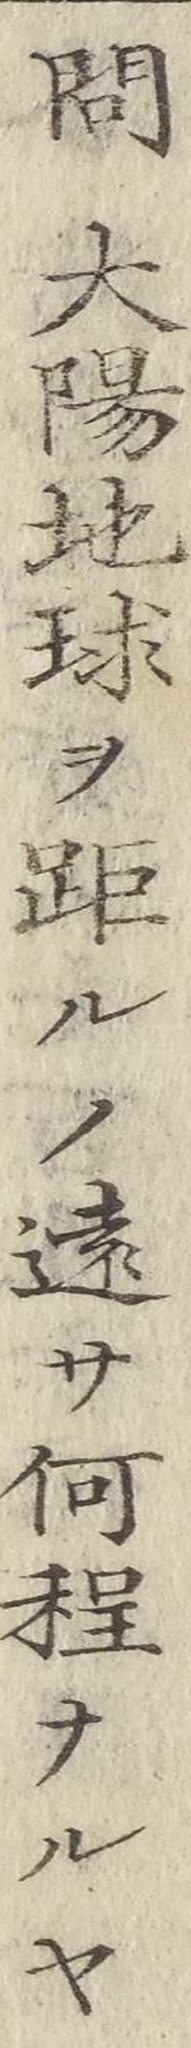問大陽地球ヲ距ルノ遠サ何程ナルヤ
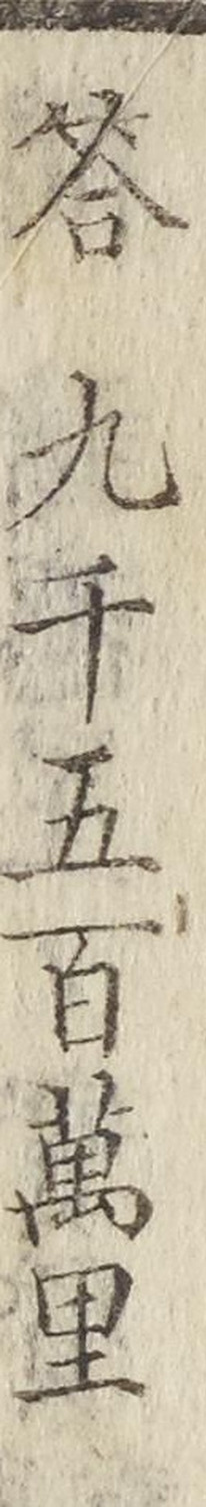答九千五百万里
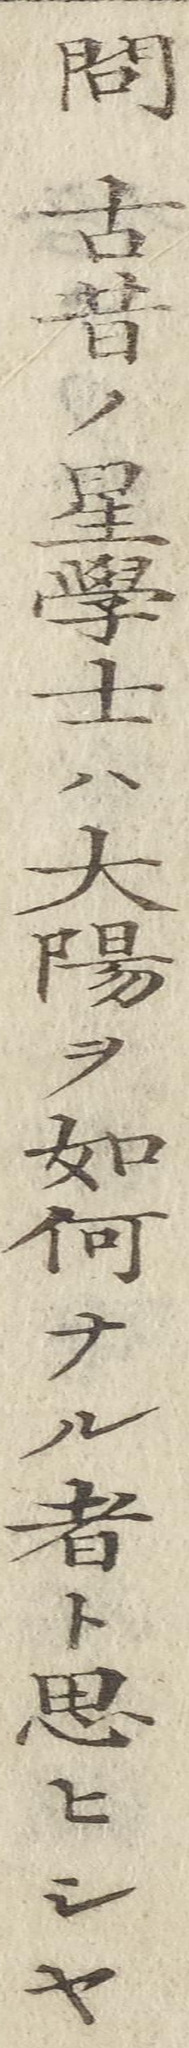問古昔ノ星学士ハ大陽ヲ如何ナル者ト思ヒシヤ
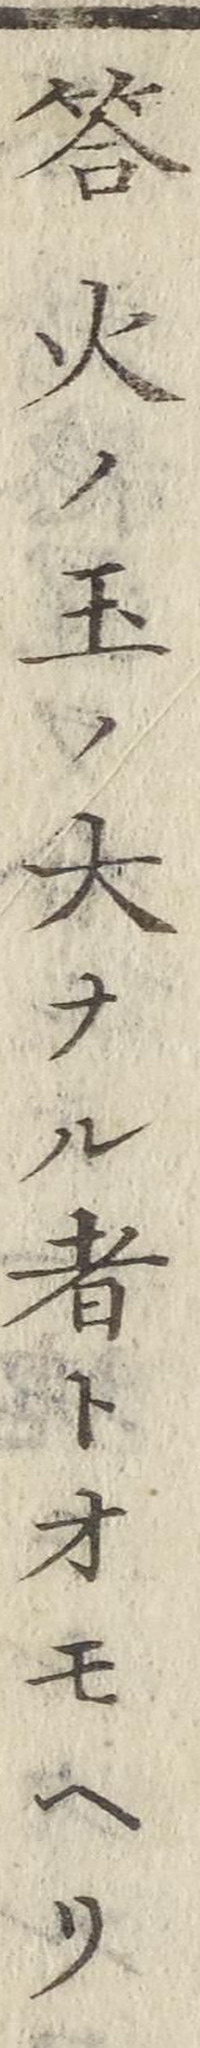答火ノ玉ノ大ナル者トオモヘリ
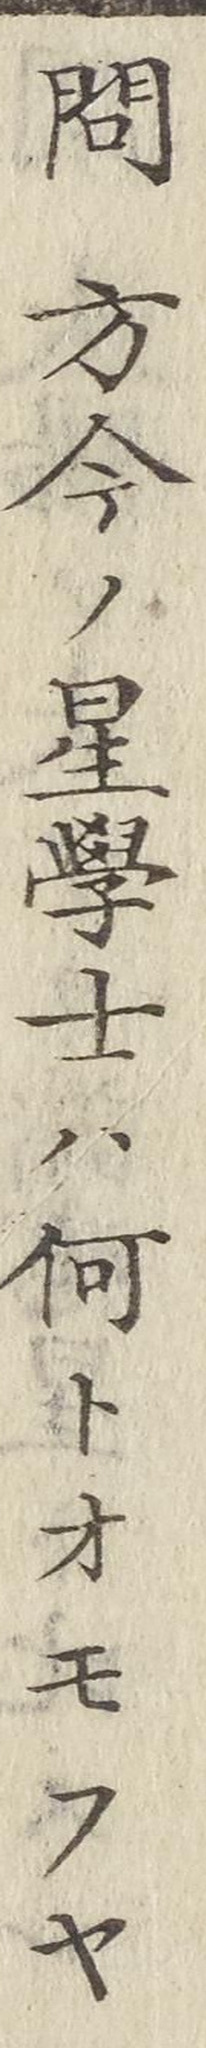問方今ノ星学士ハ何トオモフヤ
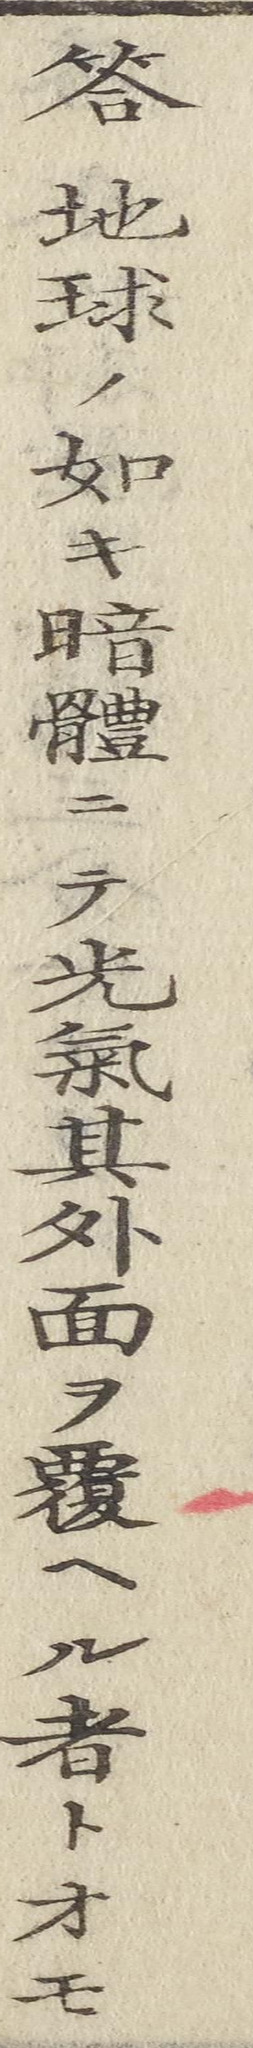答地球ノ如キ暗体ニテ光気其外面ヲ覆ヘル者トオモ
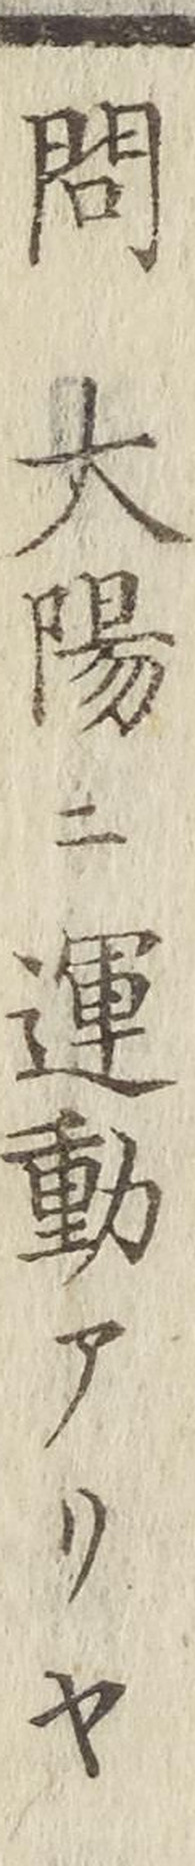問大陽ニ運動アリヤ
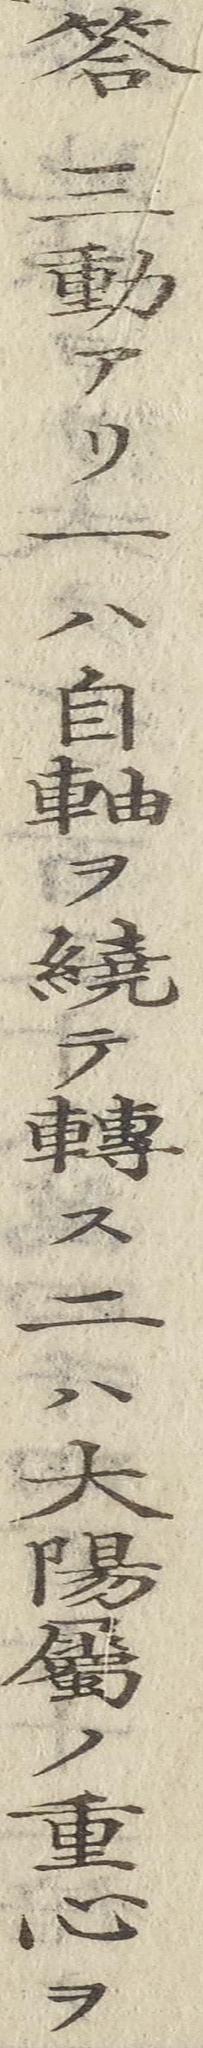答三動アリ一ハ自軸ヲ繞テ転ス二ハ大陽属ノ重心ヲ
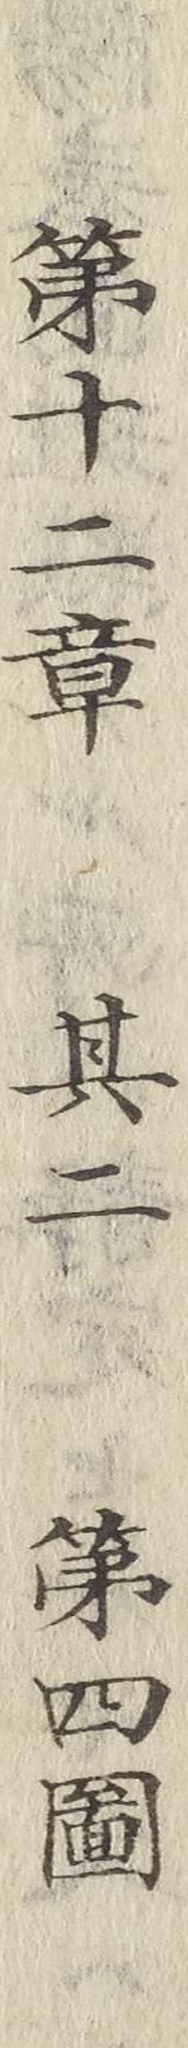第十二章其二第四図
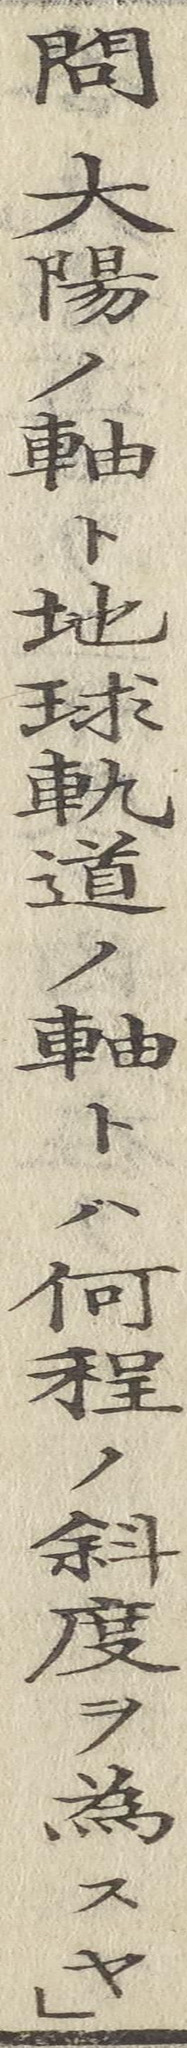問大陽ノ軸ト地球軌道ノ軸トハ何程ノ斜度ヲ為スヤ」
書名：星学圖説　上
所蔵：東京大学地震研究所図書室 Earthquake Research Institute Library, The University of Tokyo, JAPAN
